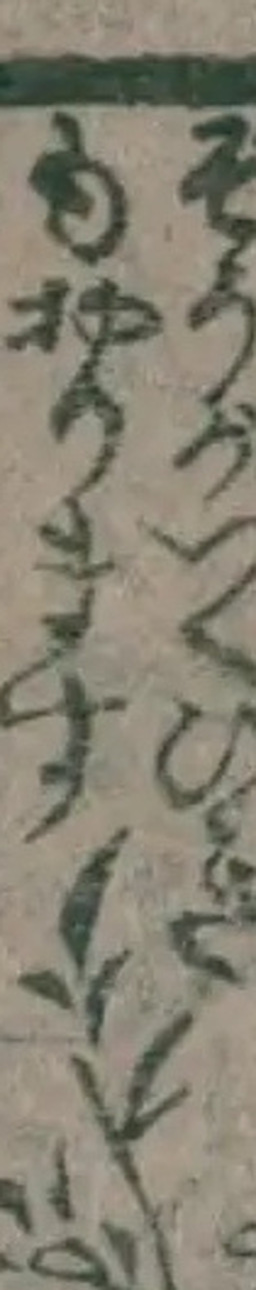もおります
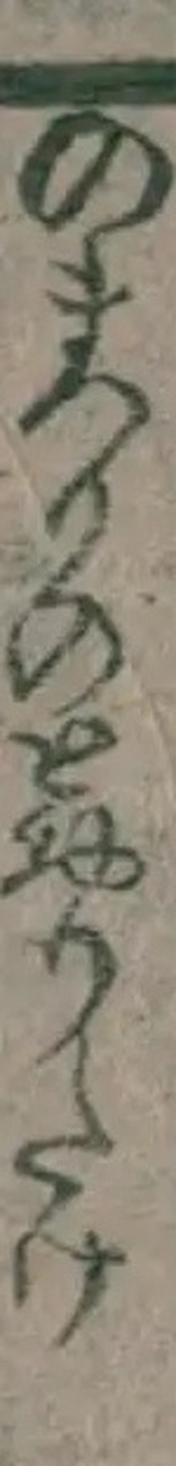のまつりのとおりたけ
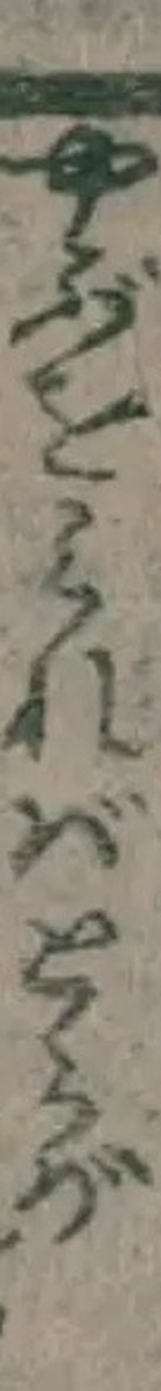やぶをみればとらが
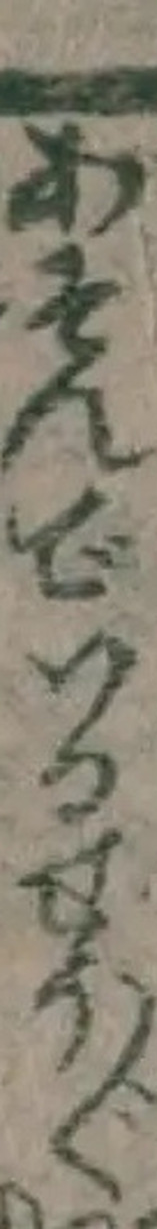あそんでいるせう〴〵
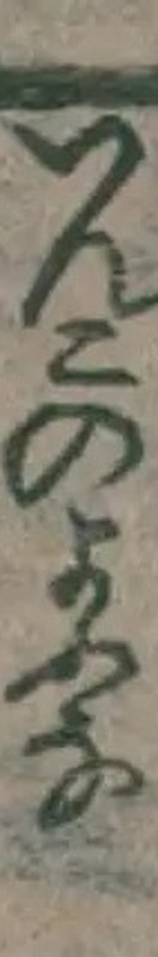いんこのよふな
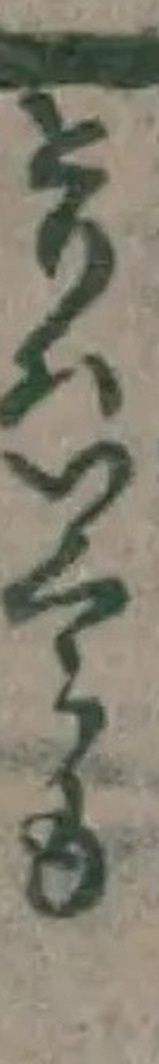とりはいくらも
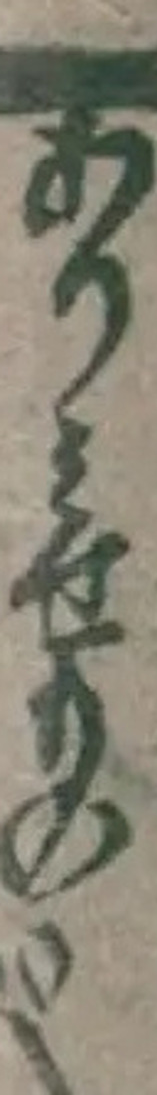ありみせもの
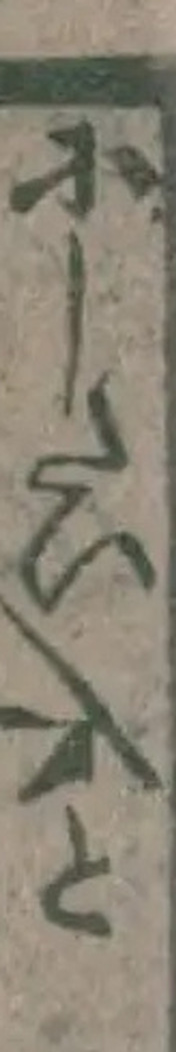にしたいと
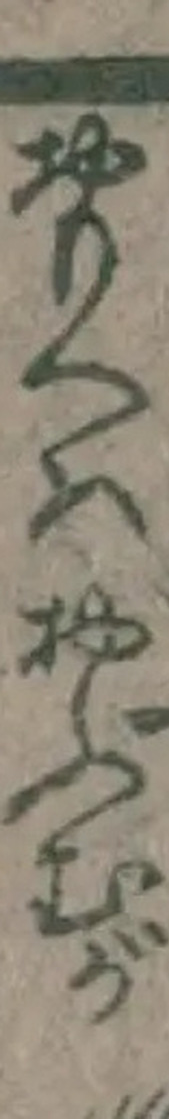おもへはおふむが
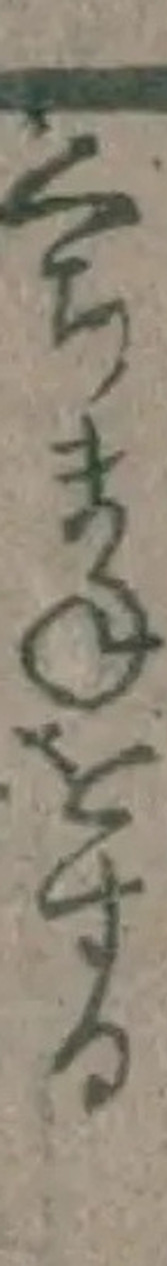くちまねをする
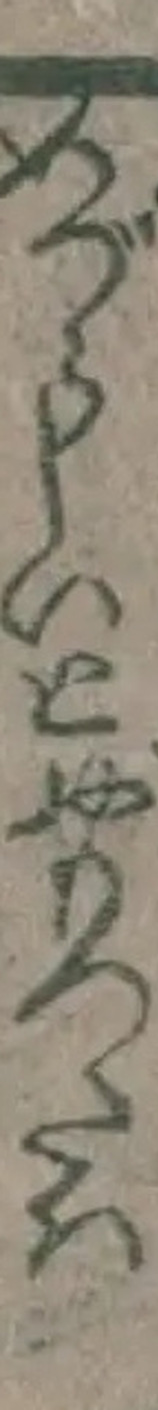めづらしいとおもつたは
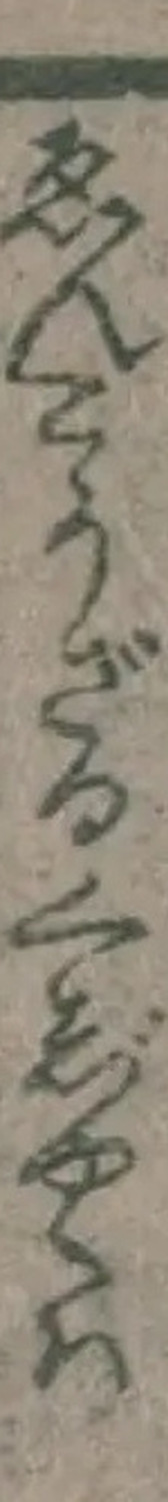ゑんこうざるくじゃくは
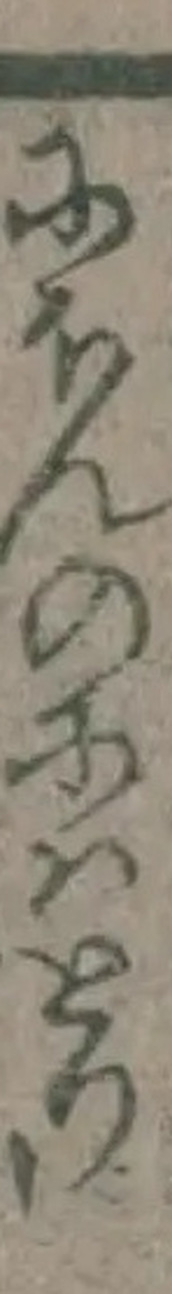にほんのにはとり
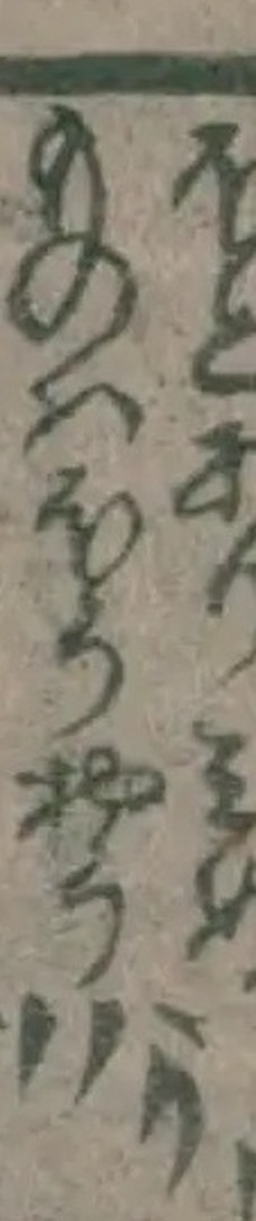ものはほうおう
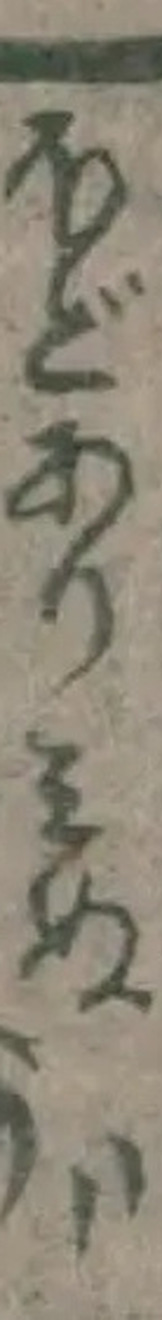ほどありみぬ
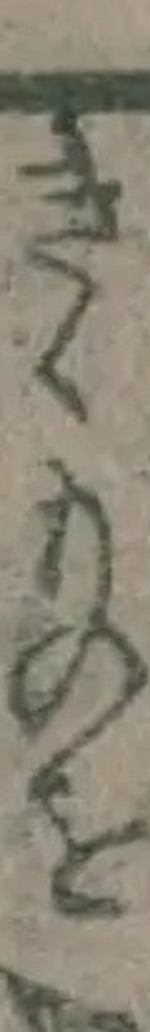きくものを
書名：縦筒放唐の噺 3巻
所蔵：国立国会図書館 National Diet Library, JAPAN
